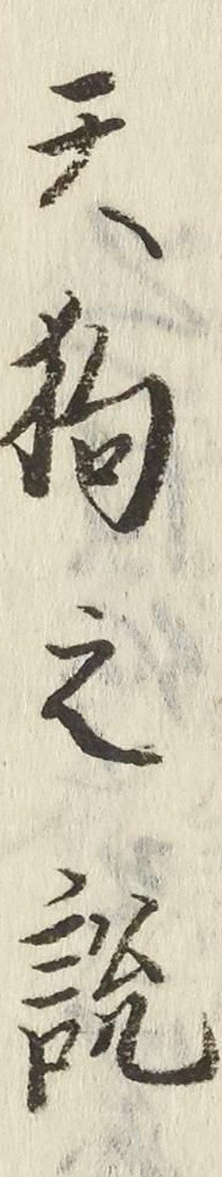天狗之説
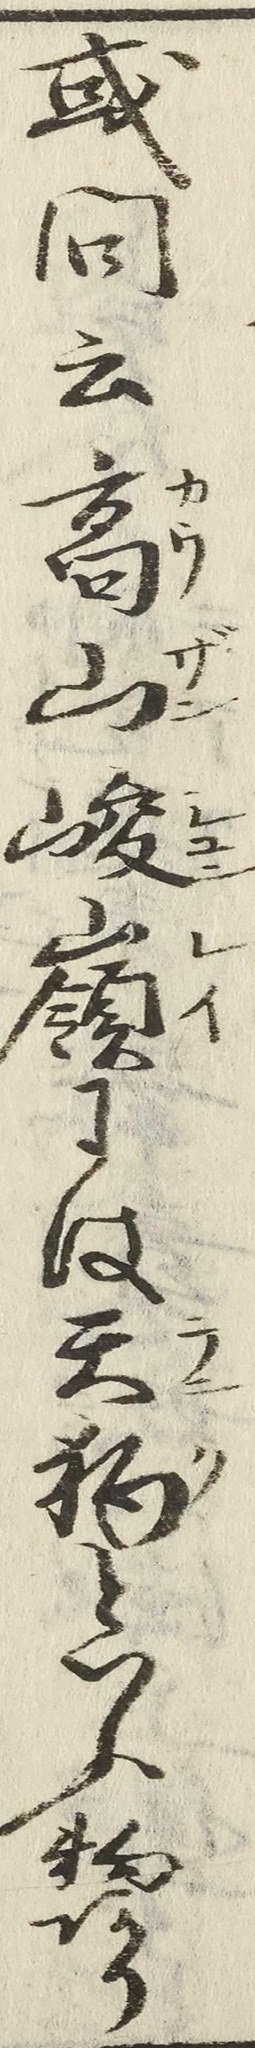或問云高山峻嶺には天狗といふ物あり
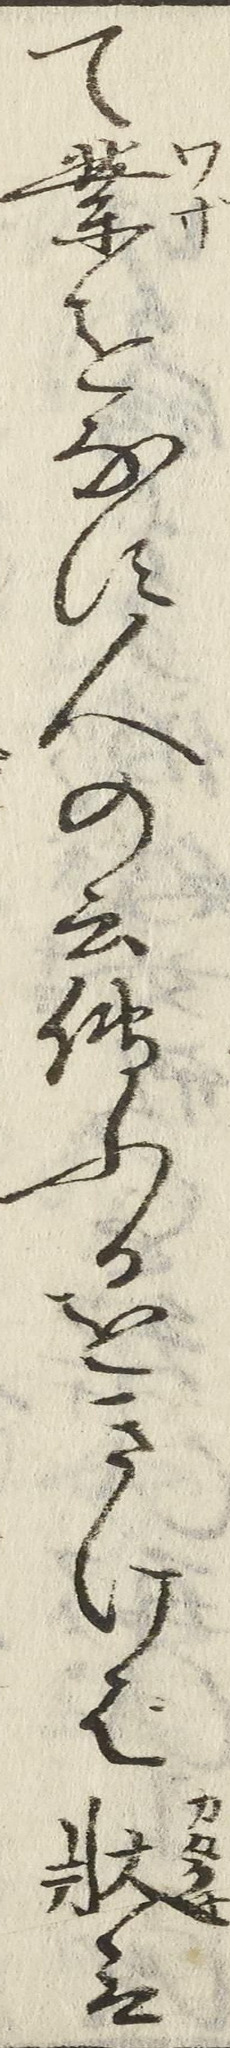て業をなす人の云伝ふるをきけば状は
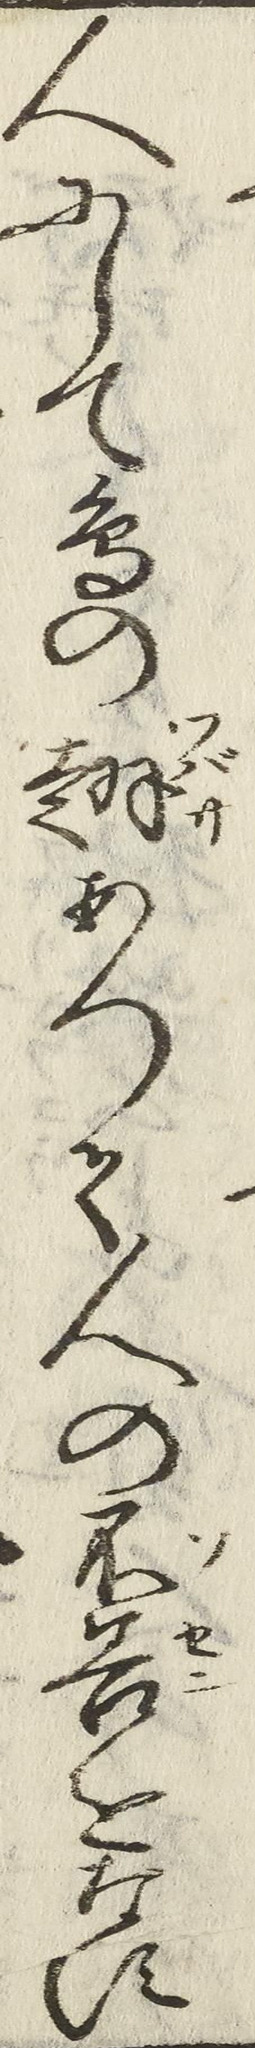人にして鳥の翅あつて人の不善となす
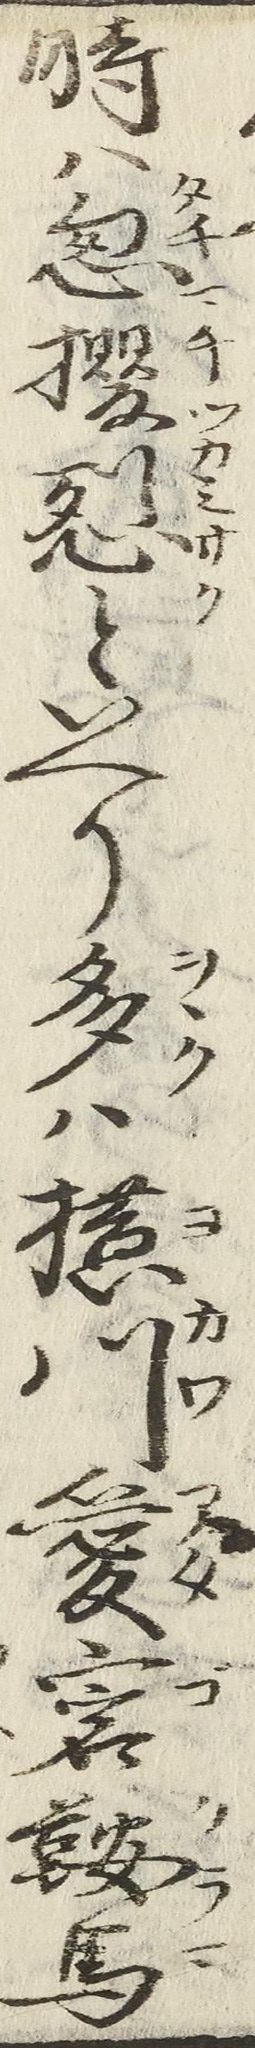時は忽攫裂といへり多は横川愛宕鞍馬
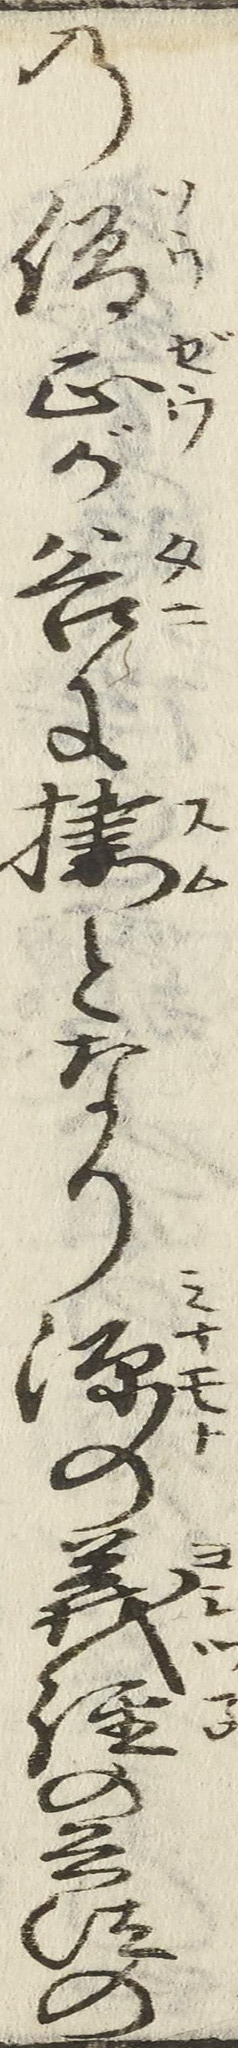の僧正が谷に棲となり源の義経の兵法の
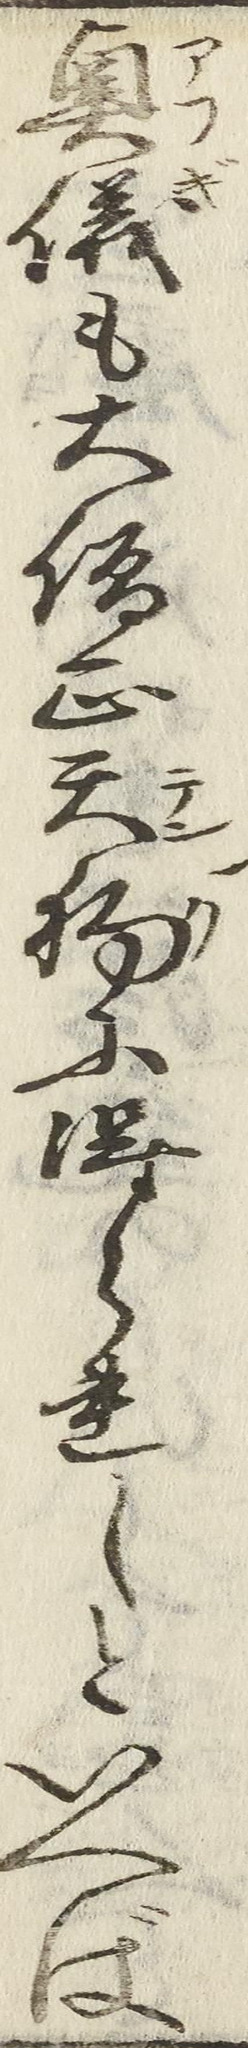奥義も大僧正天狗に得られしといへば
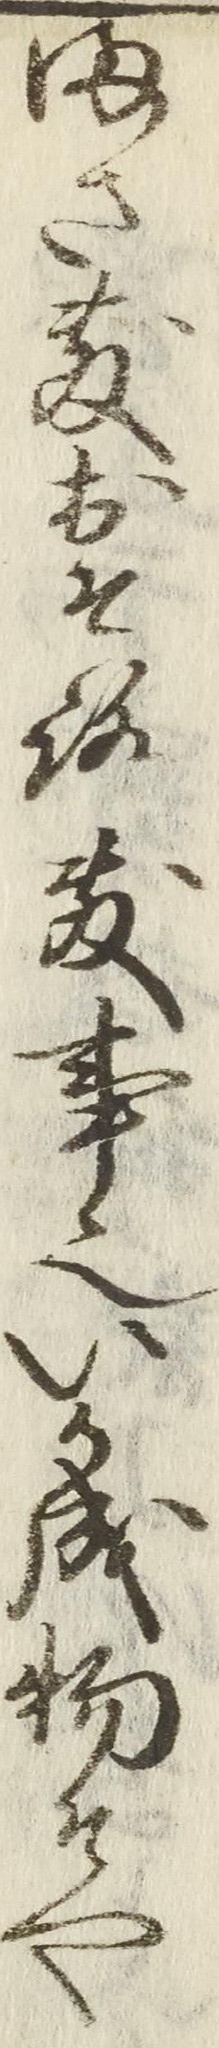まさ敷おそろ敷事也いか成物そや
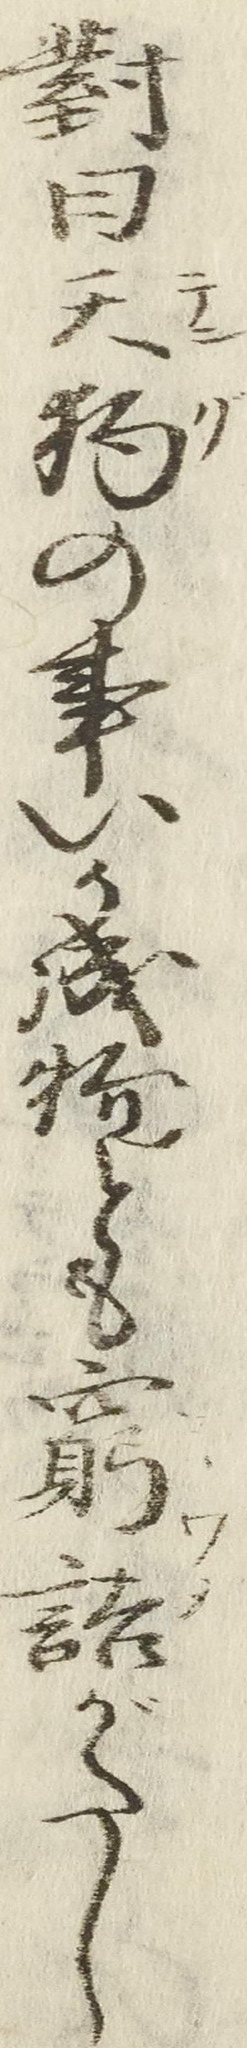対曰天狗の事いか成物とも窮詰がたし
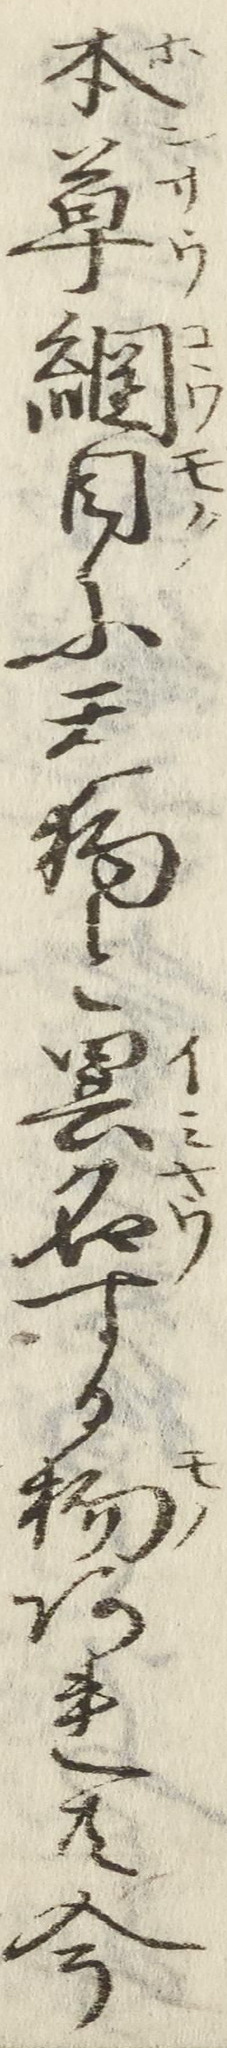本草綱目に天狗と異名する物あれ共今
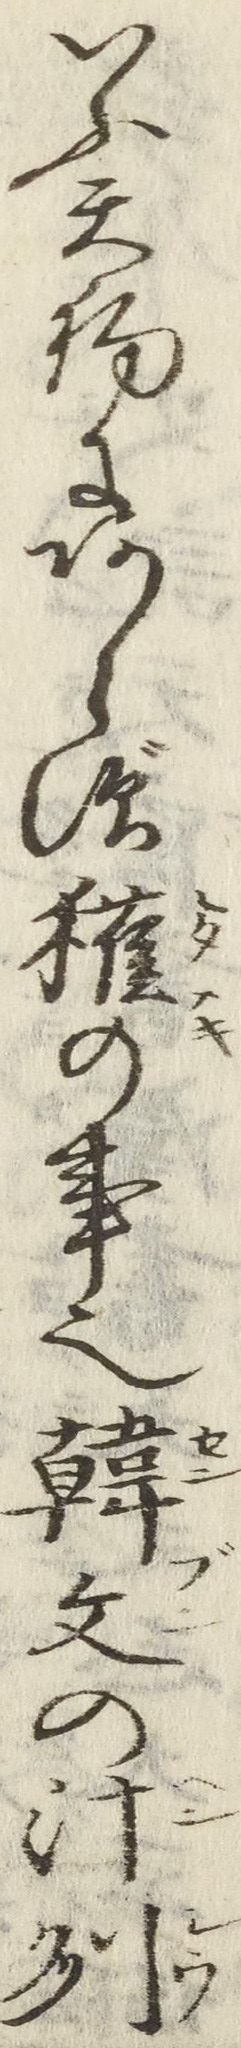いふ天狗にあらず貛の事也韓文の汴州
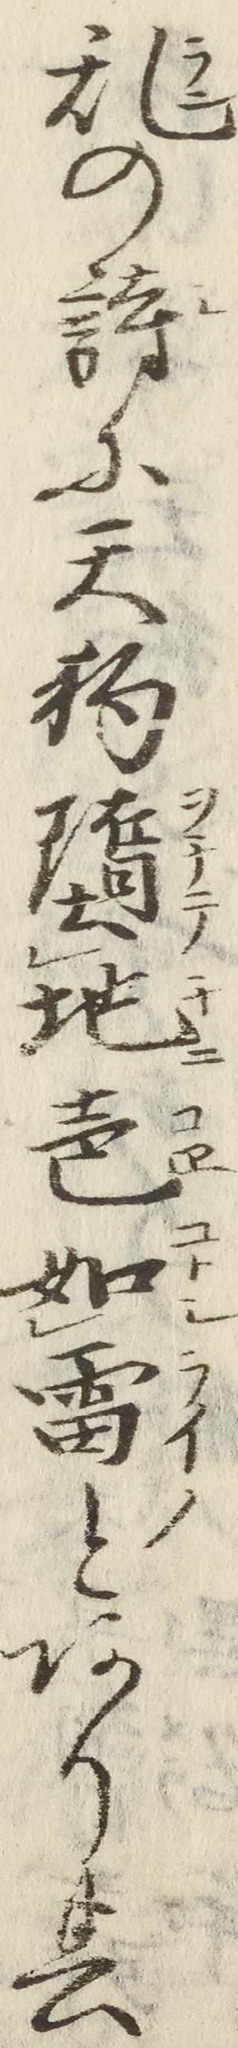乱の詩に天狗堕地声如雷とあり其
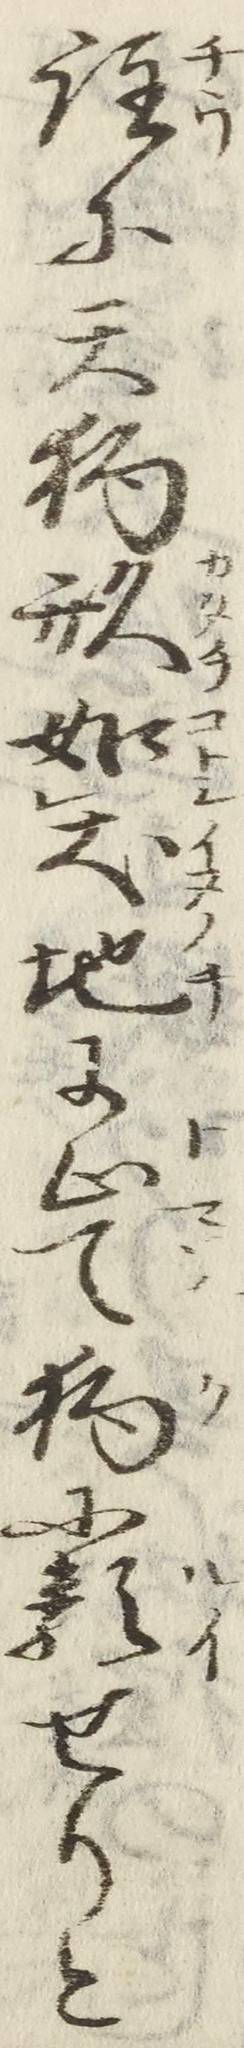註に天狗形如犬地に止て狗に類せりと
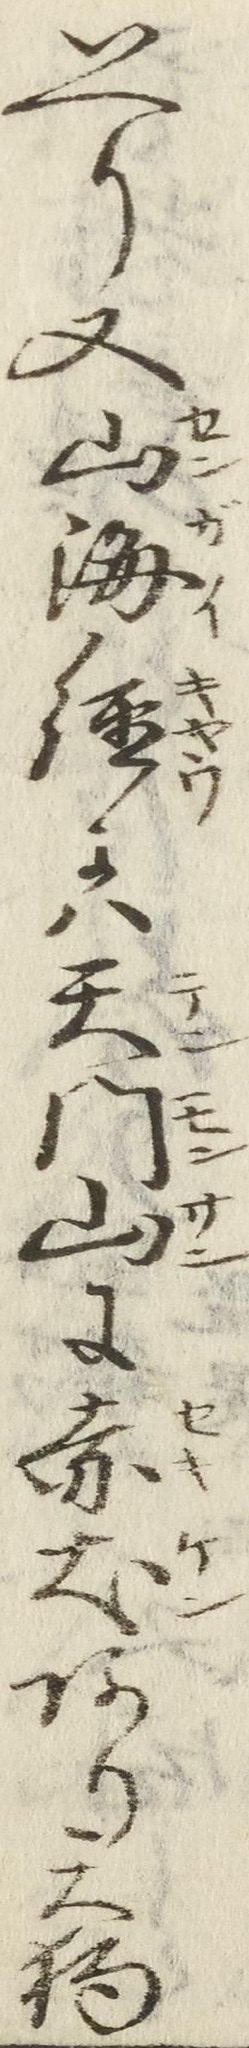いへり又山海経には天門山に赤犬あり天狗
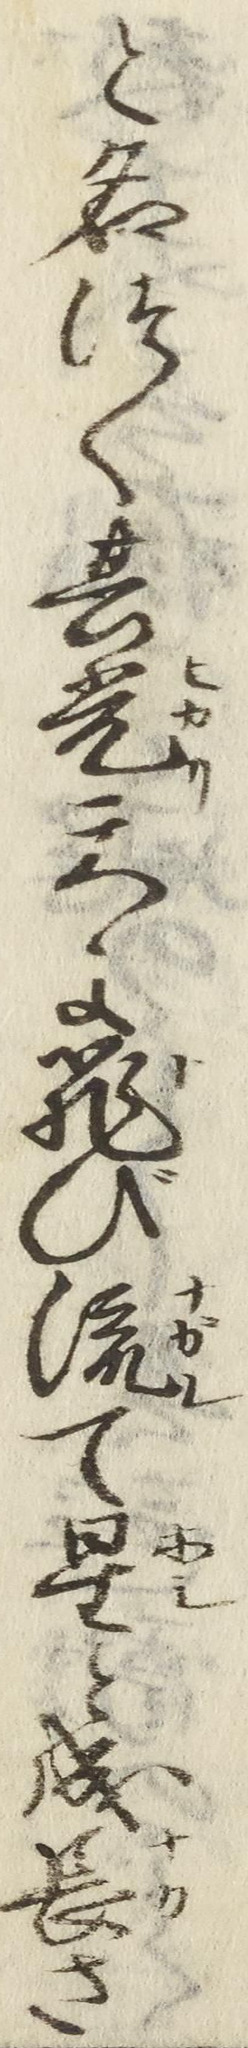と名つく其光天に飛び流て星と成長さ

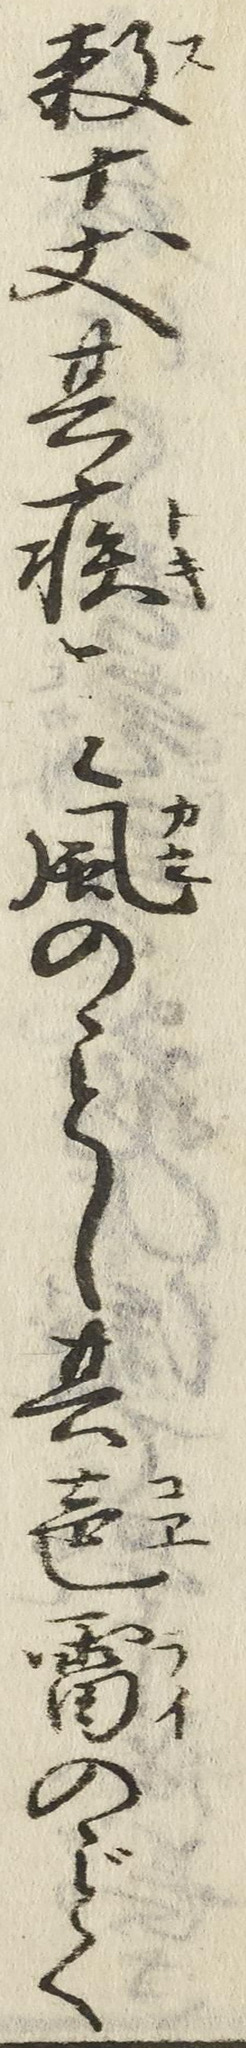数十丈其疾こと風のことし其声雷のごとく
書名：天地或問珍　地
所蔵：東京大学地震研究所図書室 Earthquake Research Institute Library, The University of Tokyo, JAPAN
